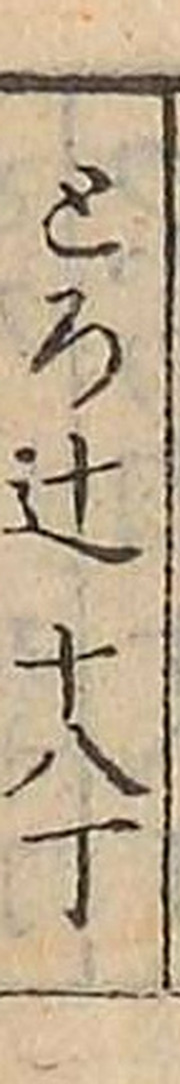とろ辻十八丁
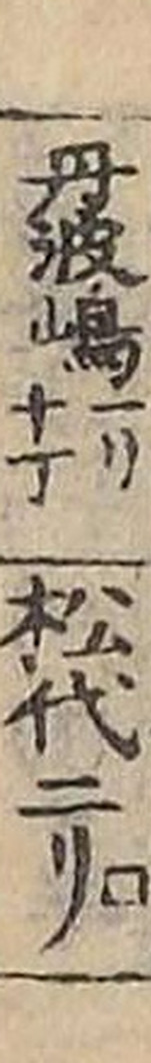丹波市一リ

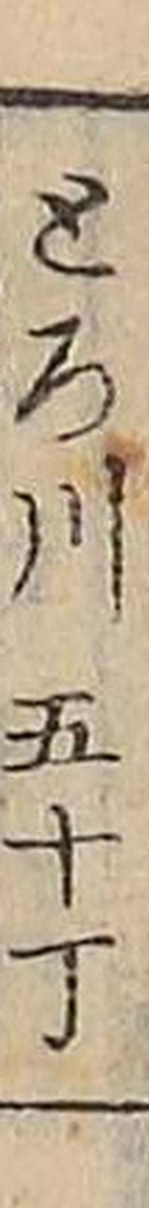とろ川五十丁
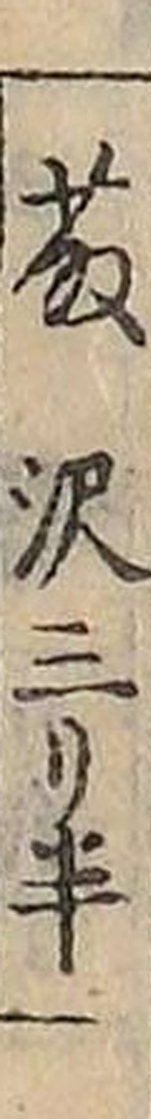藤沢三リ半
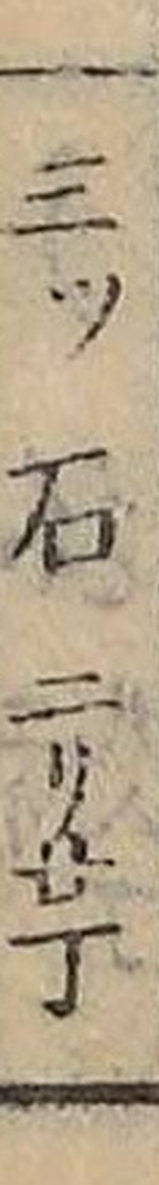三ツ石二リ廿丁
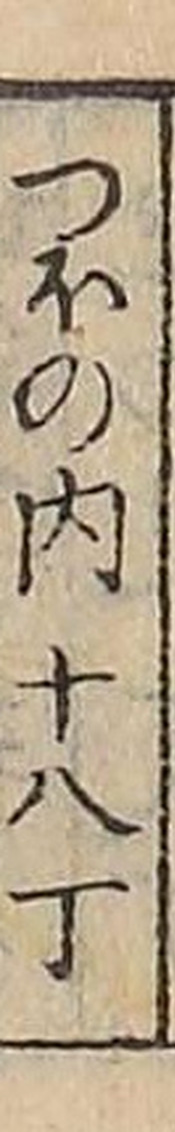つほの内十八丁
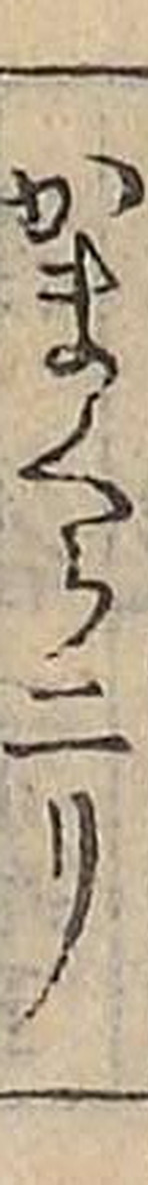かまくら二リ
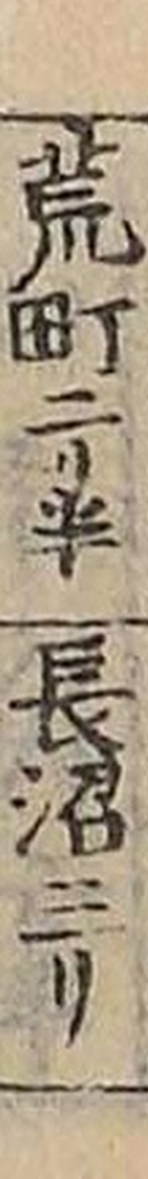荒町二リ半長沼三リ
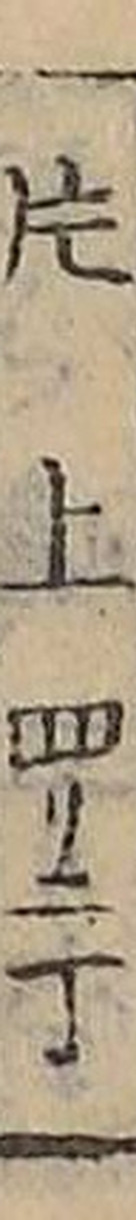片上四リ二丁
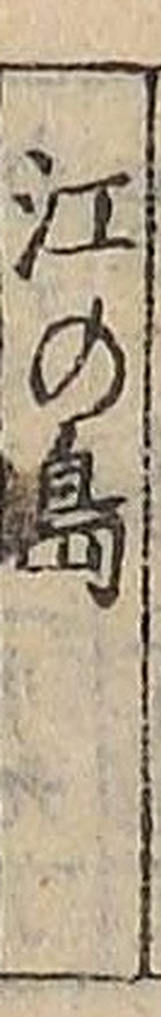江の島
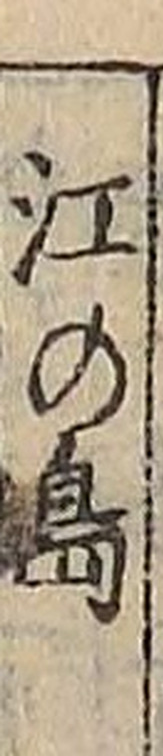江の島
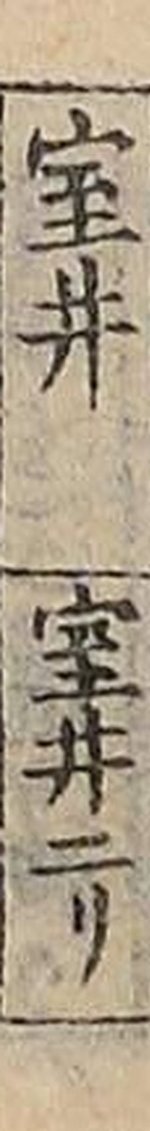室井室井二リ
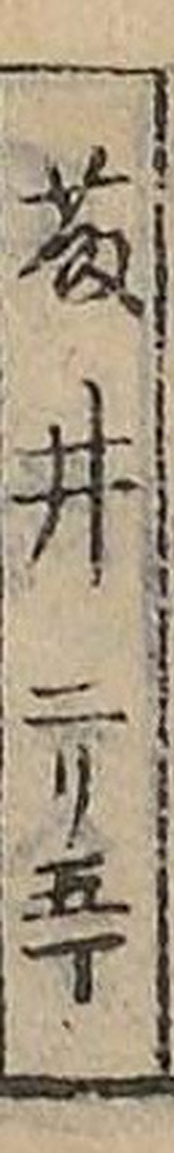藤井二リ五丁
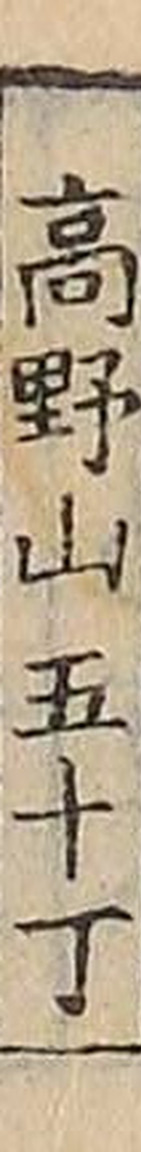高野山五十丁
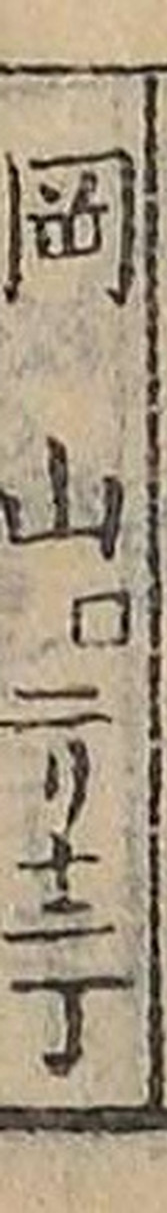岡山▫二リ十二丁
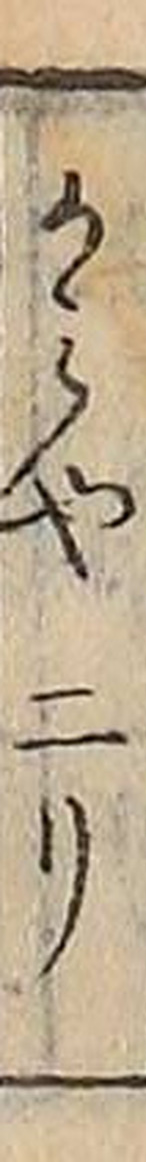かみや二リ
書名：旅行用心集
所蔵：神戸大学附属図書館 国文学研究資料館
